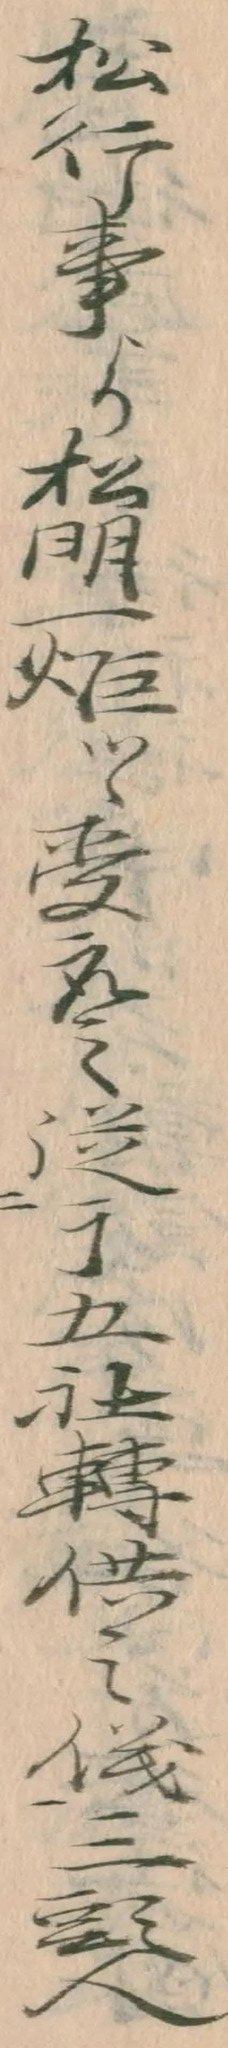松行事より松明一炬ツヽ受取之従于五社轉供之儀三頭人
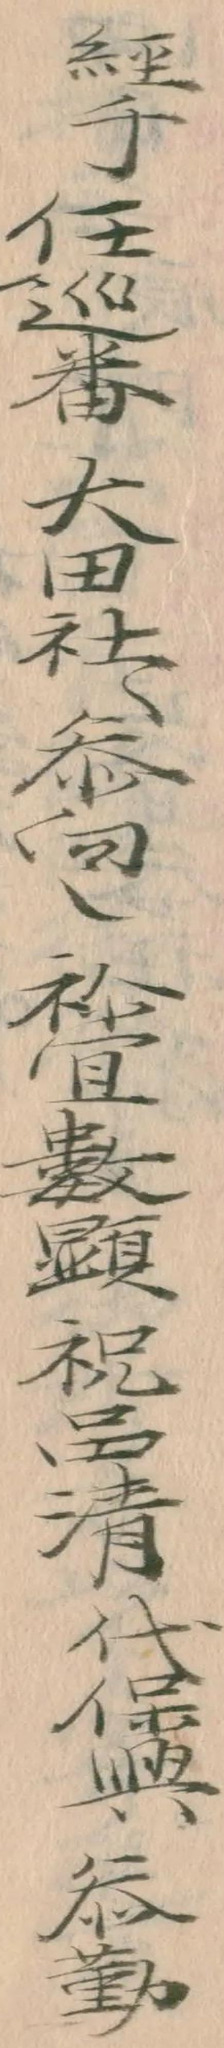経千任巡番大田社へ参向也祢宜數顕祝品清代保興参勤
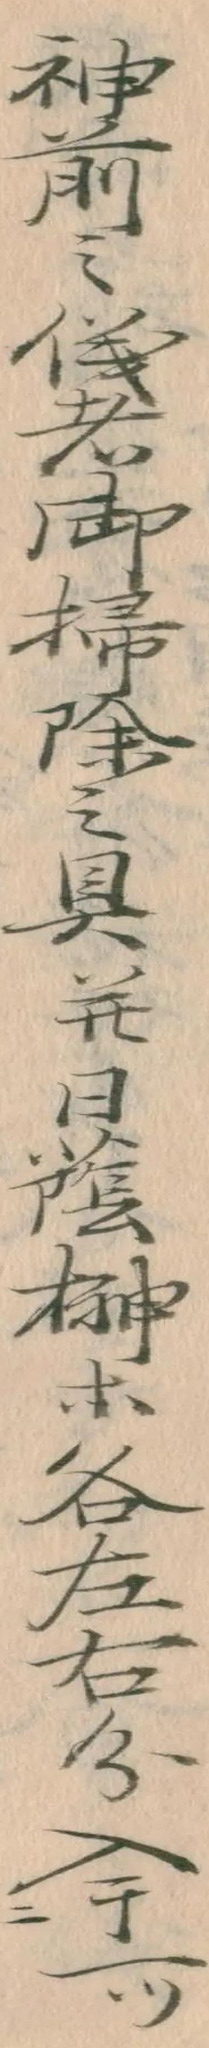神前之儀は御掃除之具并日蔭榊等各左右分入于一ツ
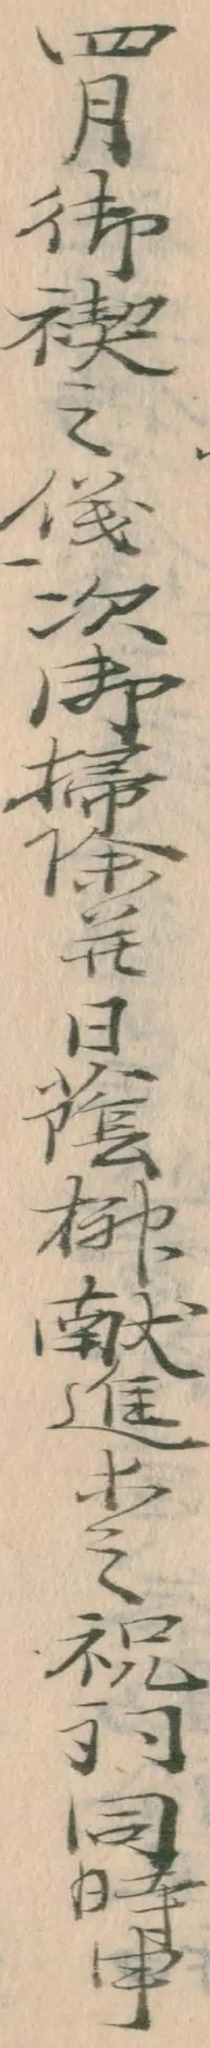四月御禊之儀次御掃除并日蔭榊献進等之祝詞同時申
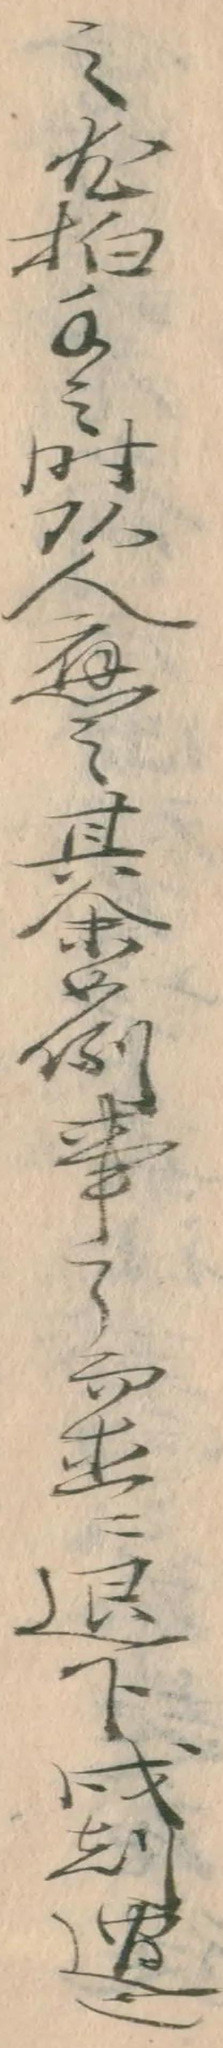之尤拍手之時頭人應之其余御例事了而直に退下戌刻過也
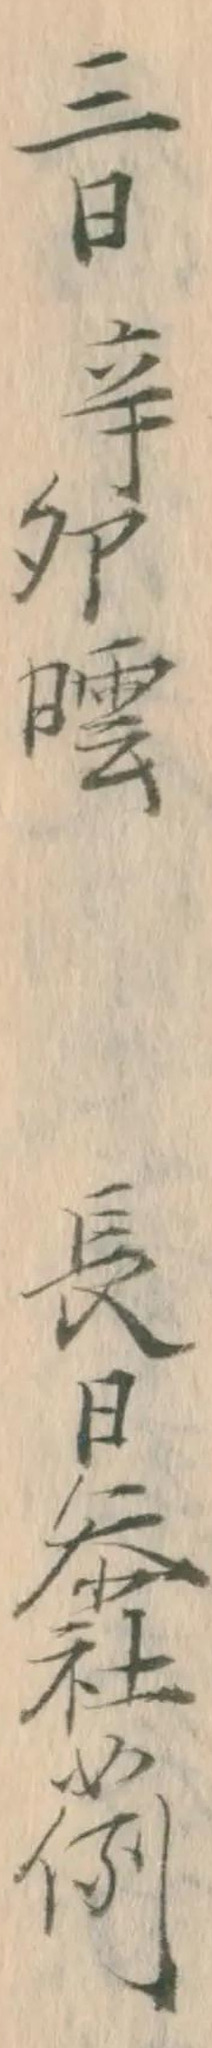三日辛卯曇長日参社如例
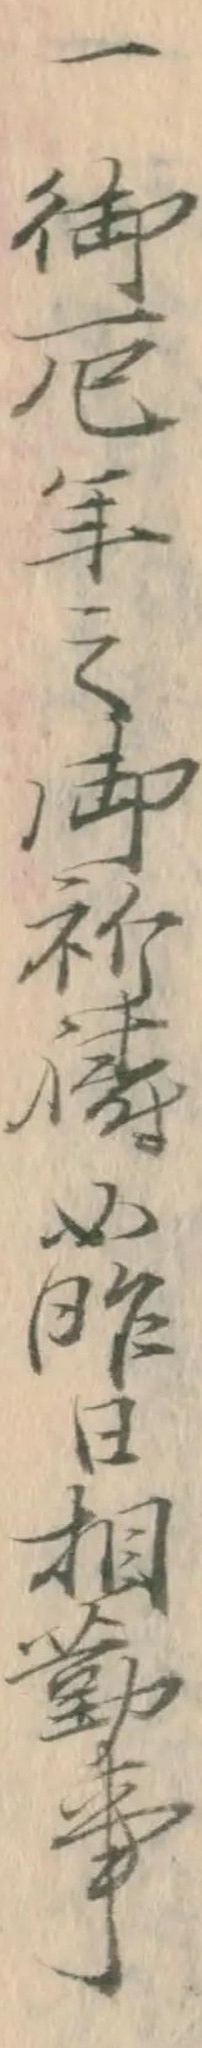一御厄年之御祈祷如昨日相勤事

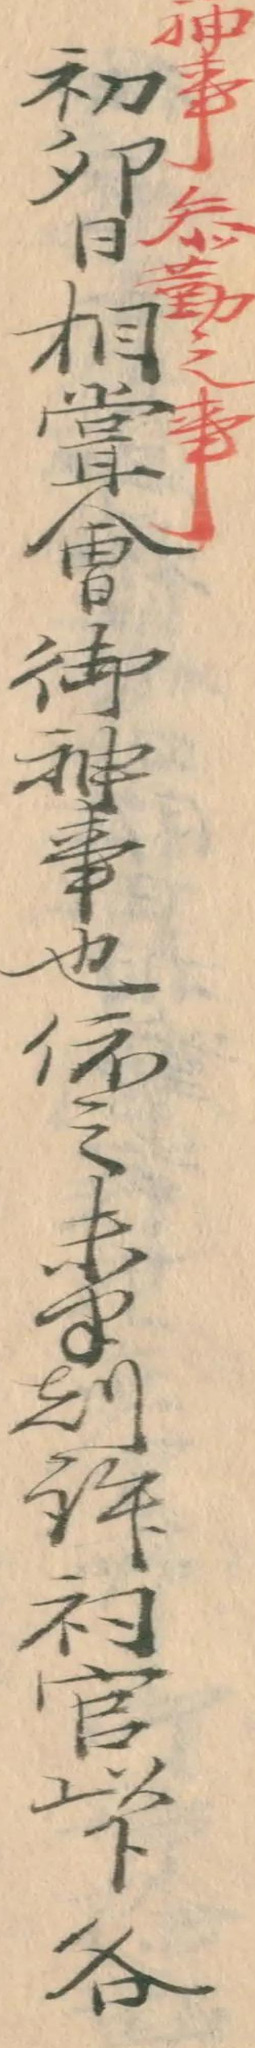一初卯日相嘗會御神事也依之未半刻許祠官以下各
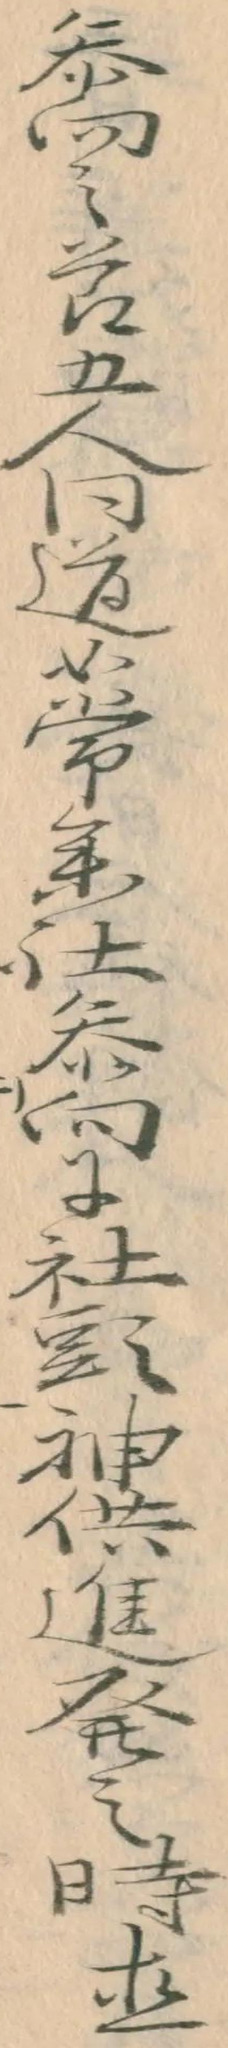参向之節五人同道如常参社参向于社頭神供進発之時直
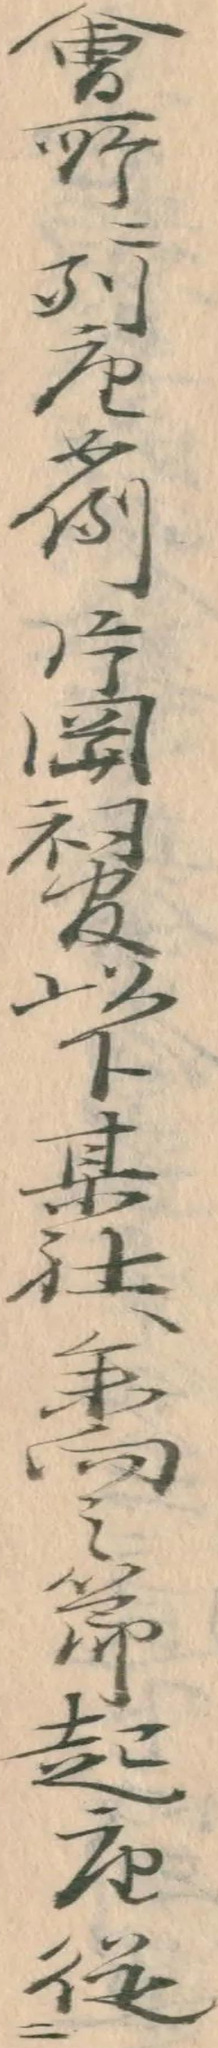會所ニ列座如例片岡祠官以下某社へ参向之節起座従
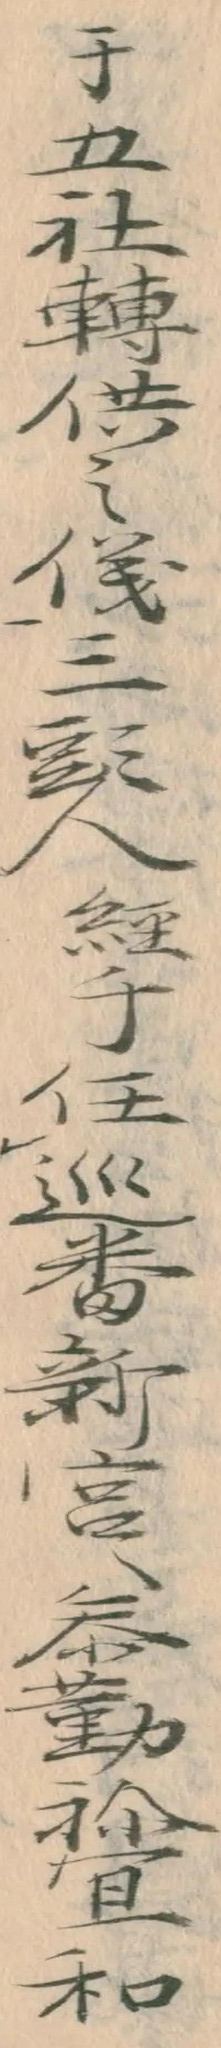于五社轉供之儀三頭人経千任巡番新宮へ参勤祢宜和
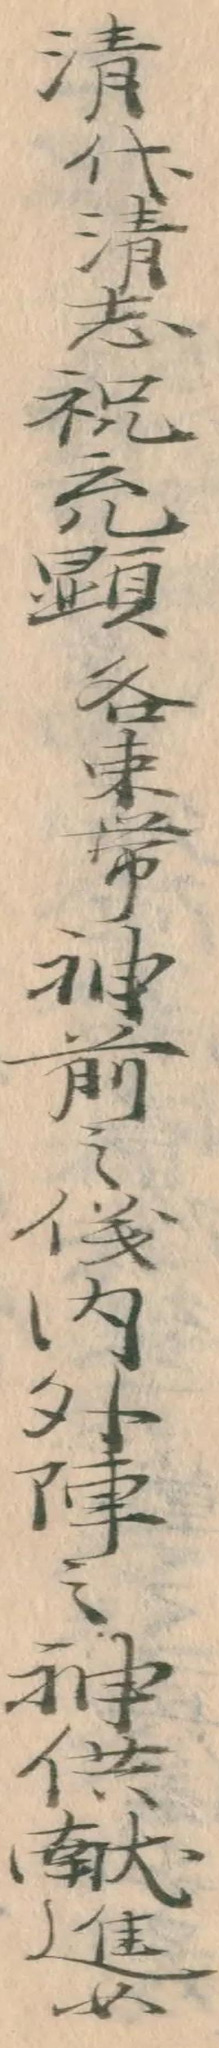清代清志祝充顕各束帯神前之儀内外陣之神供献進如
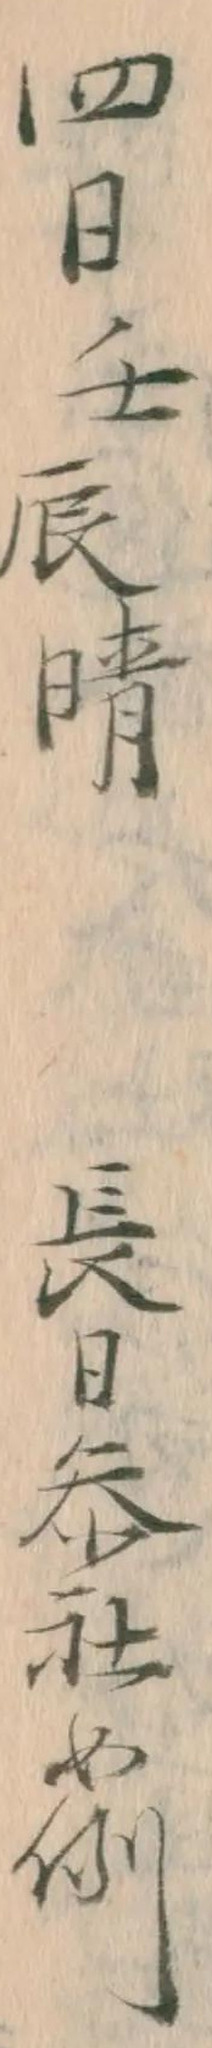四日壬辰晴長日参社如例
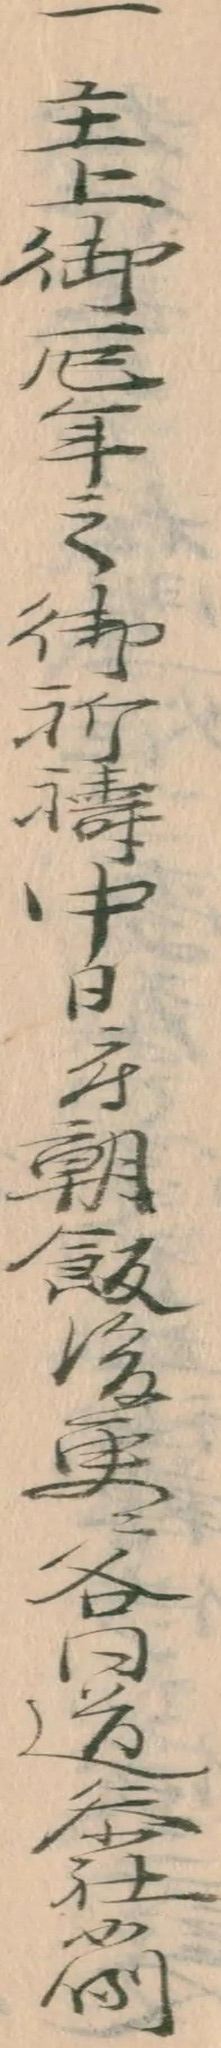一主上御厄年之御祈祷中日ニ付朝飯後更ニ各同道参社如例
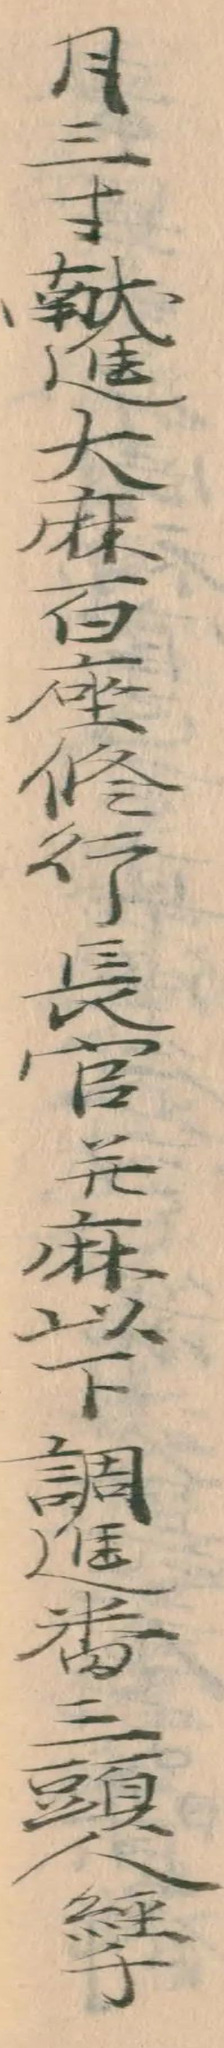月三寸献進大麻百座修行長官并麻以下調進番三頭人経千
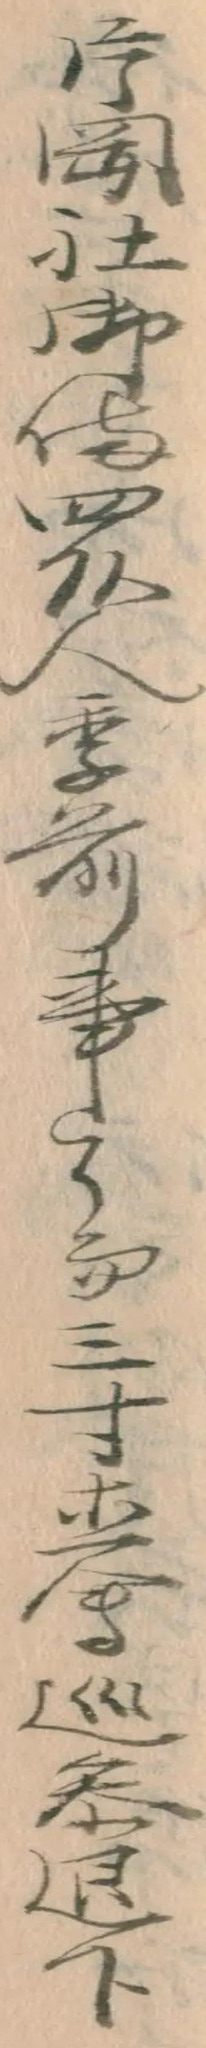片岡社御備四頭人季前事了而三寸直會巡参退下
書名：賀茂社記録. 第74冊
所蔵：国立国会図書館 National Diet Library, JAPAN
